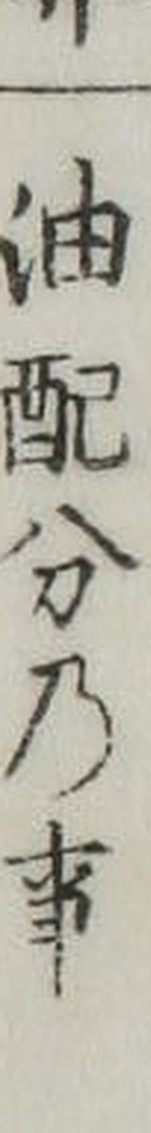油配分の事
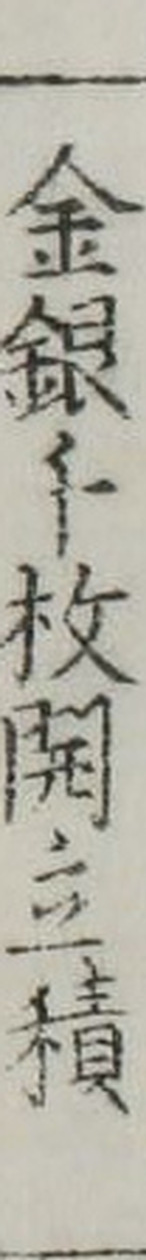金銀千枚開立積
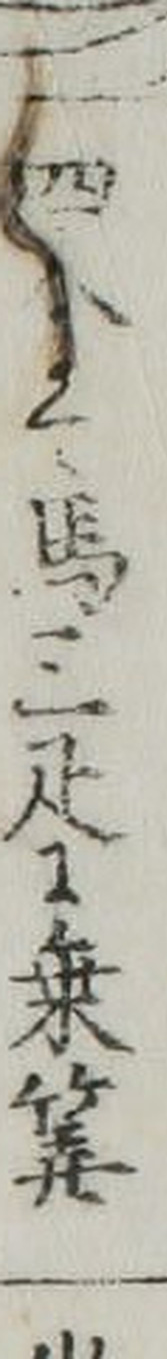四人馬三疋に乗算
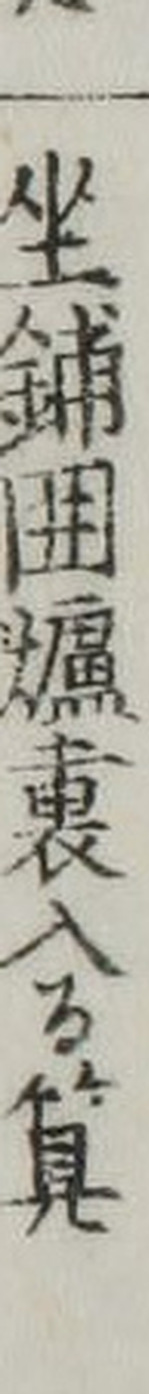坐鋪囲炉裏入る算
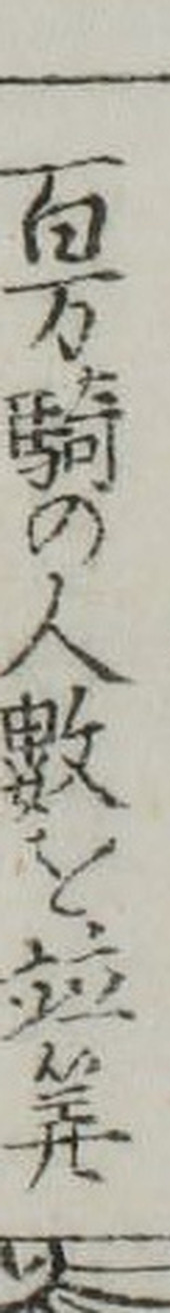百万騎の人数を並算
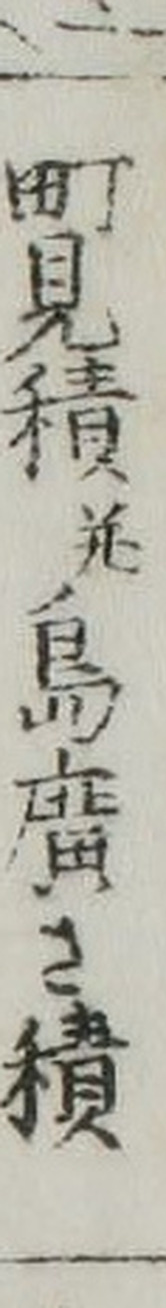町見積并島広さ積
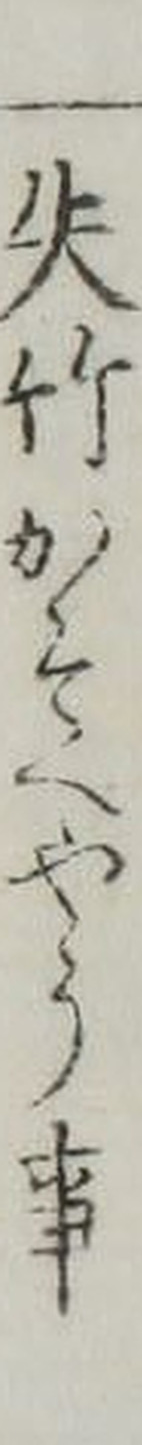失竹かそへやう事
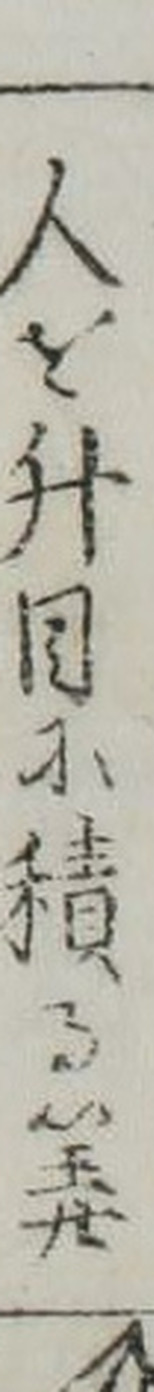人を升目に積る算
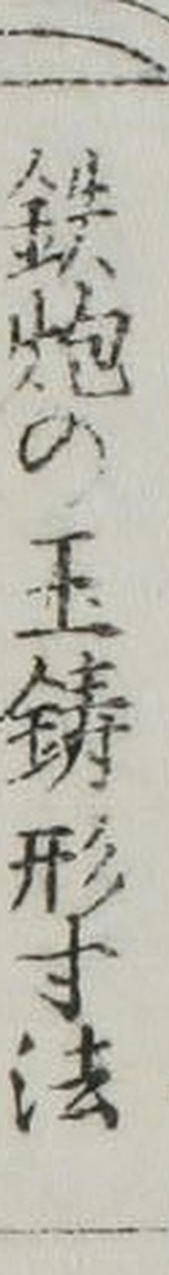鉄炮の玉鋳形寸法
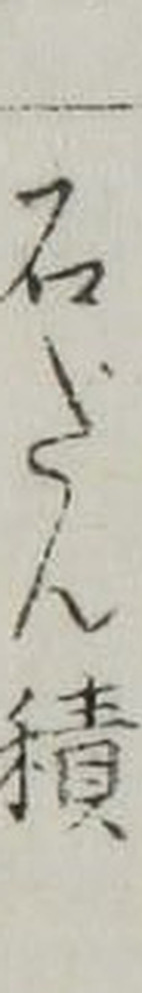石だん積
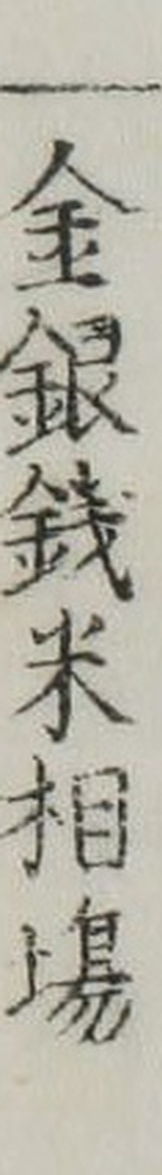金銀銭米相場
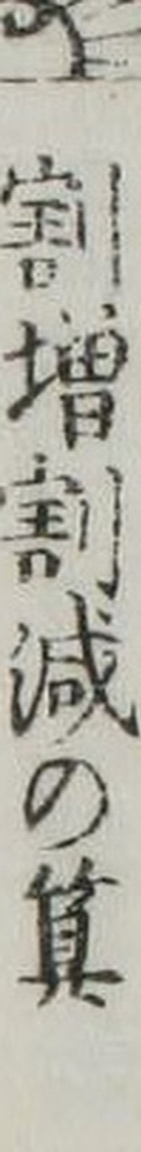割増割減の算
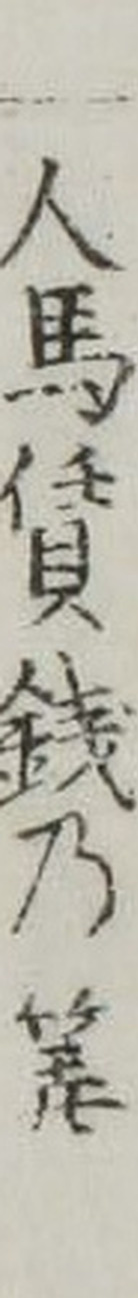人馬賃銭の算
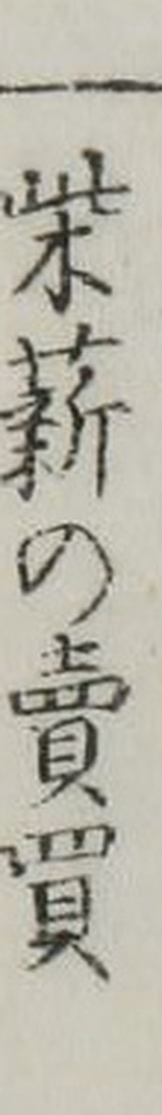紫薪の売買
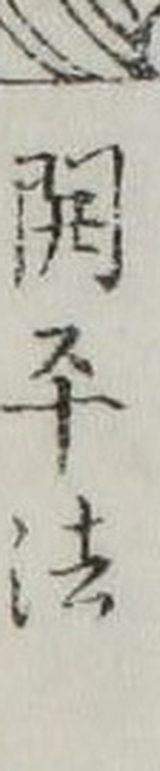開平法
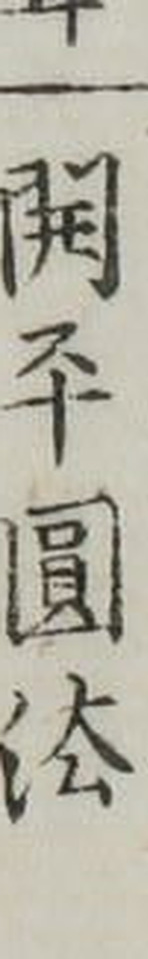開平円法
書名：宝玉塵劫記
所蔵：東京学芸大学教育コンテンツアーカイブ
